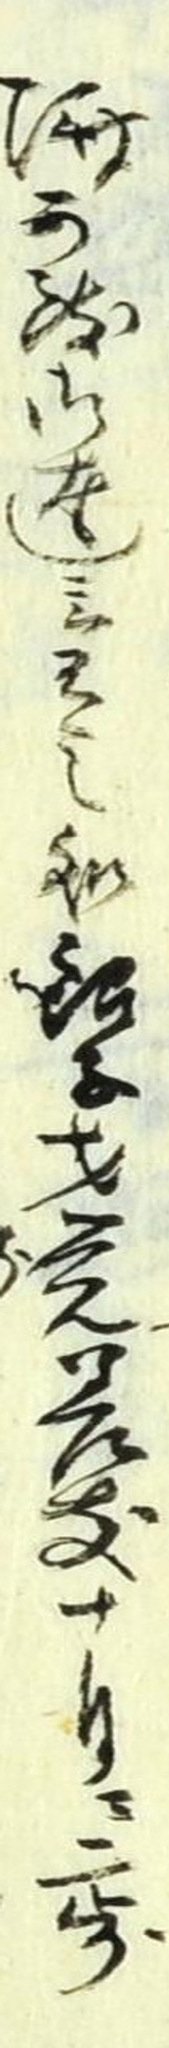済可致御達ニ而有之処銀子才覚差支十月ニ二歩
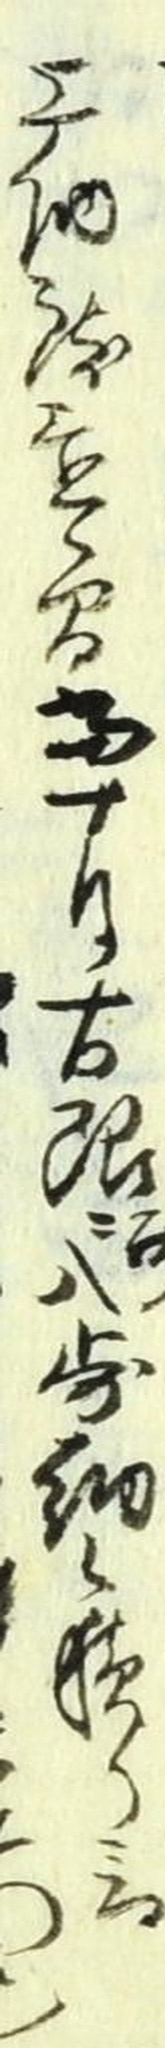上納致置候間当十月十日限ニ残八歩納候積りニ而
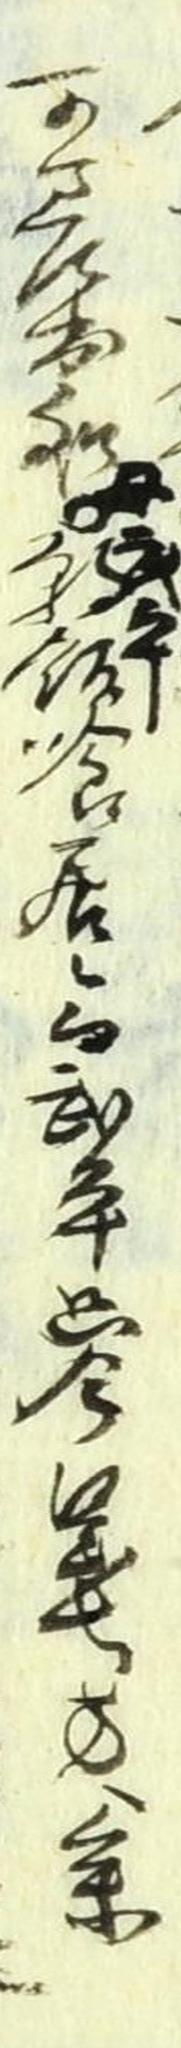可差出候処「母武平」朝飯喰居候而武平只今里長方へ参
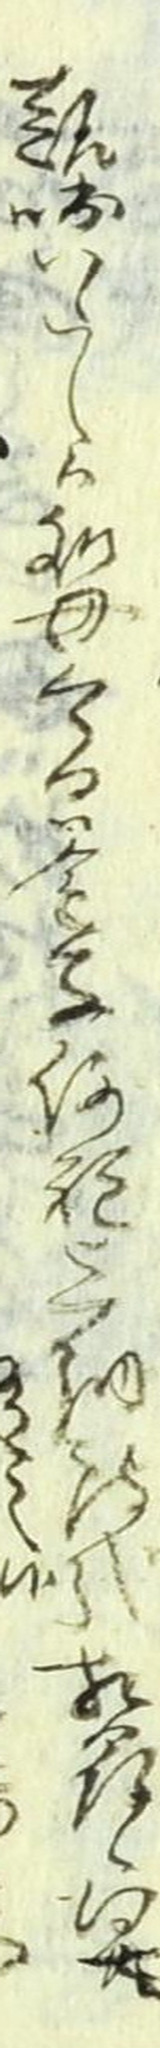趣咄いたし候処母今日ハ金子何程上納致哉相尋候得者
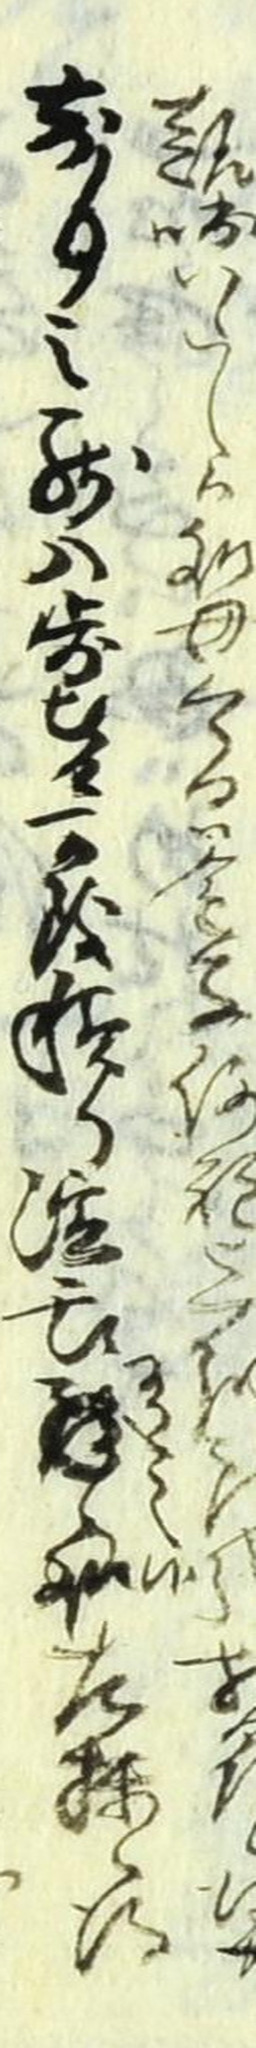前月之残八歩皆可致積り演舌有之候処左様候得
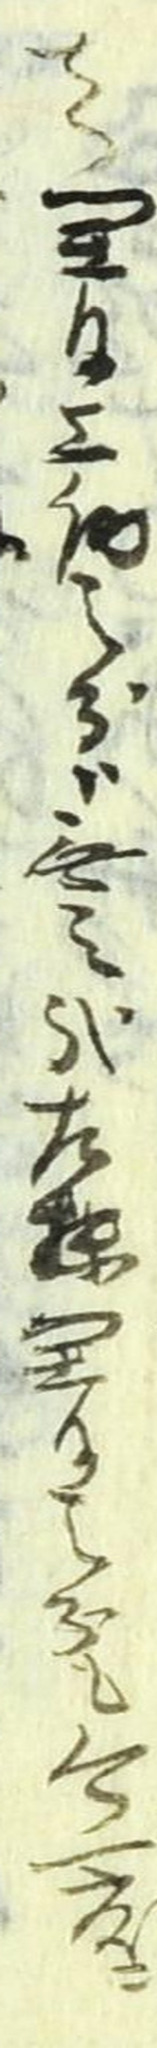者閏月上納之分ハ無之哉左様閏月之分も今一度ニ
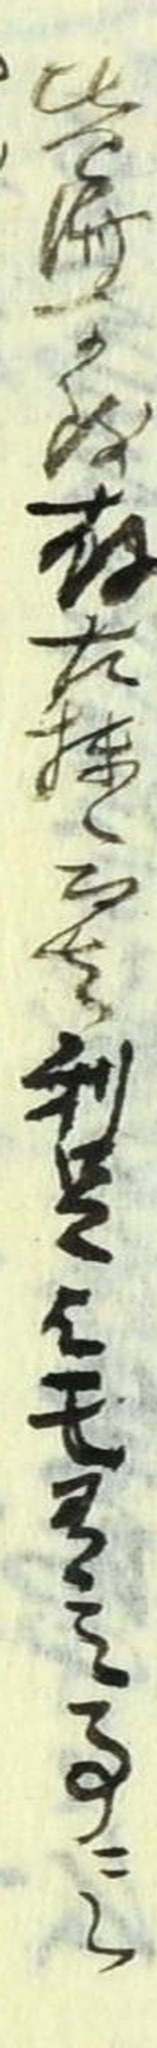皆済可致存左様候而者利足与モ有之事ニ候
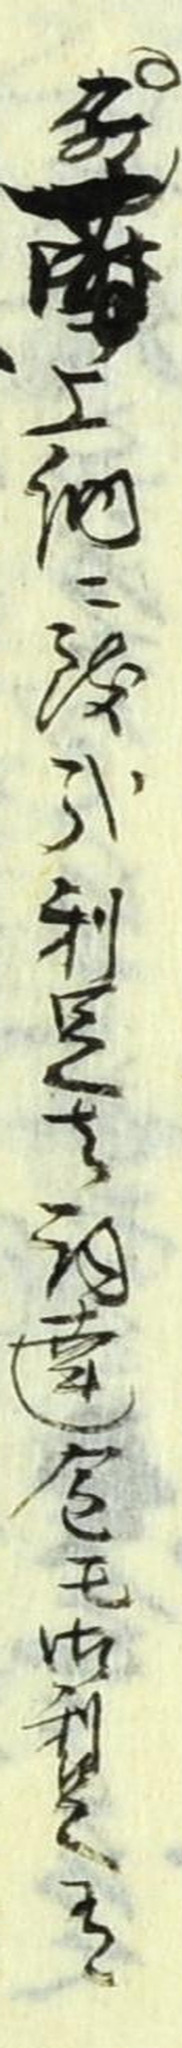○今一時上納ニ致哉利足者調達金モ御利足有
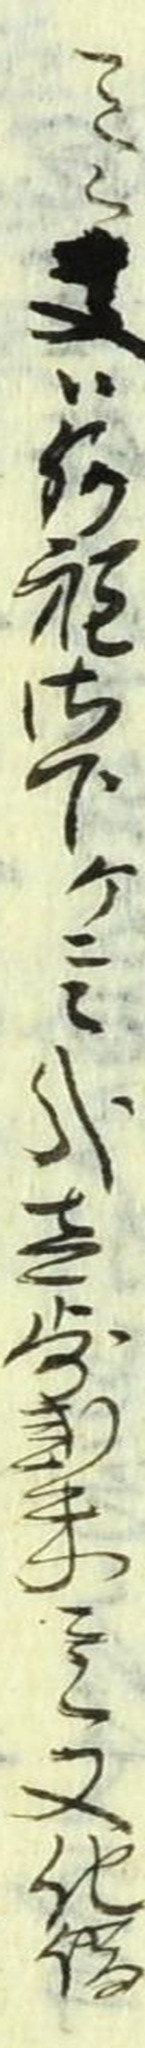之候夫ハ何程御下ケニ候哉壱歩弐朱ニ候又他借
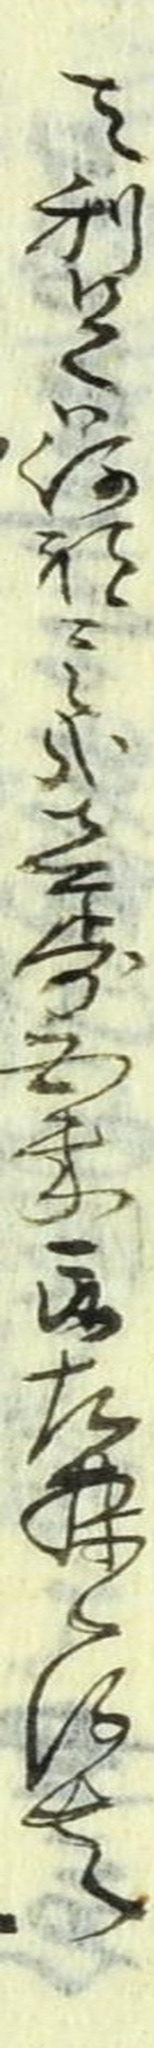之利足ハ何程ニ候哉壱歩五朱ニ候左様候得者
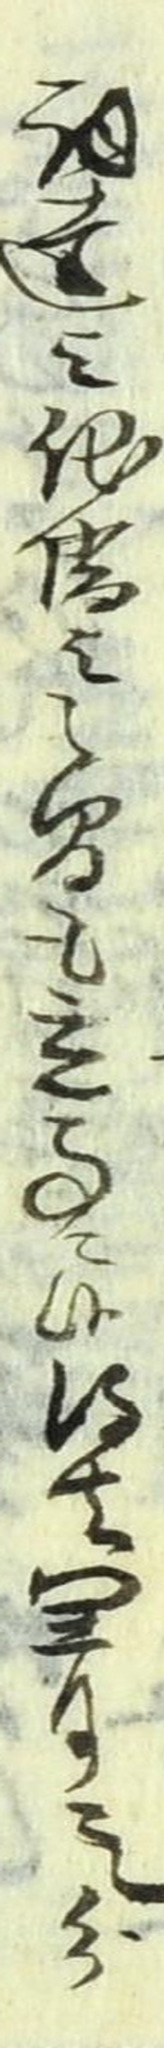調達与他借与之間も立事ニ候得者閏月之分
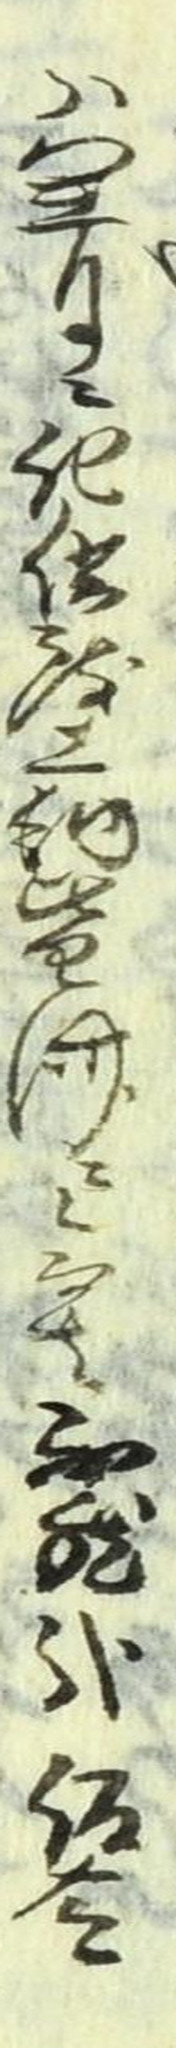ハ閏月ニ他借致上納皆済ニ候而者不然哉仮令
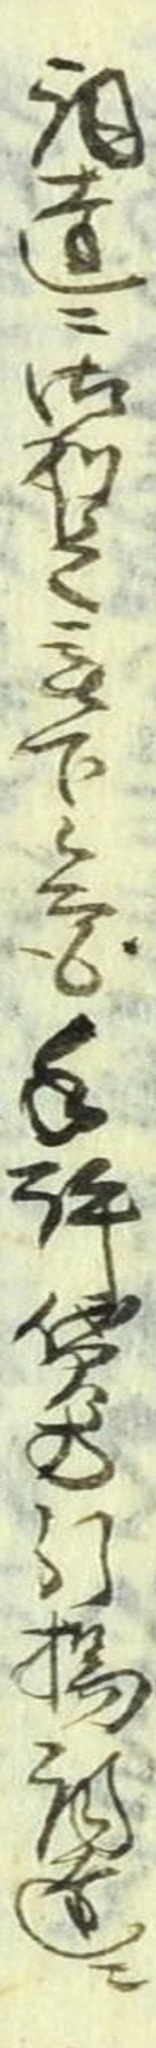調達ニ御利足被下候而も手許貸方引揚調達ニ
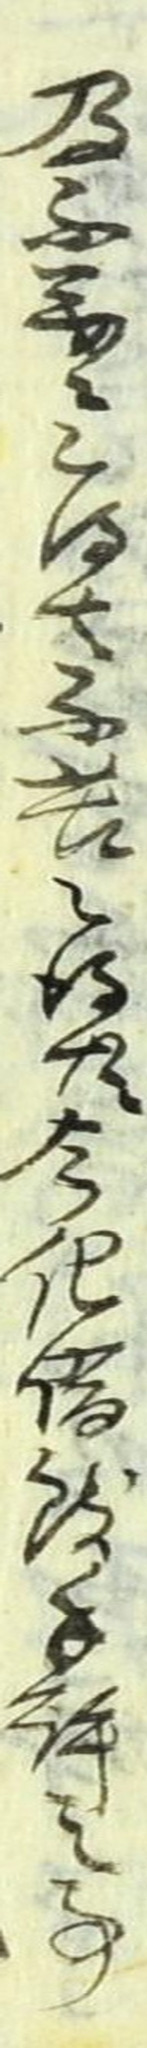及不義ニ候得者不苦候得共今他借致手許之事
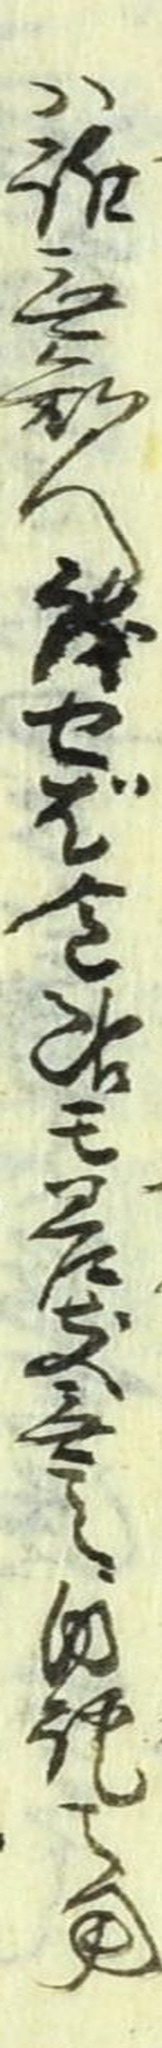ハ誰無知人致セば金銀モ差支無之内証之用
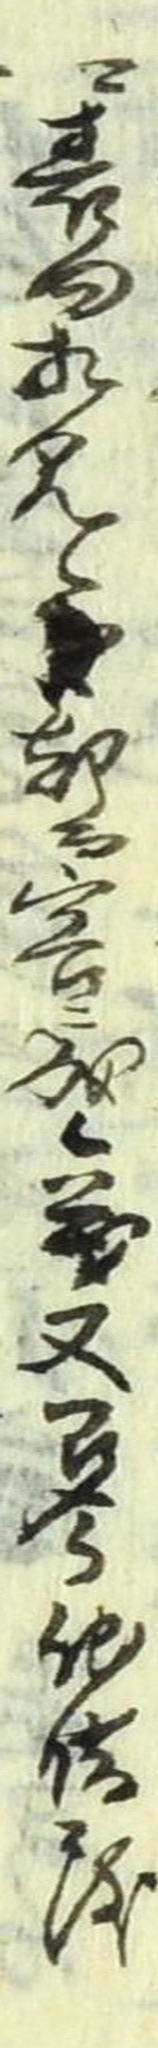ニ表向相見候却而害ニ成候義又即今他借致
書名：（日記）
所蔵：福井県文書館 Fukui Prefectural Archives
